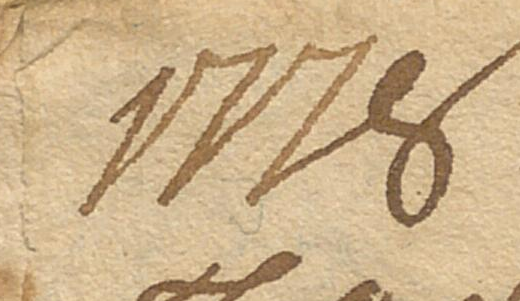1778
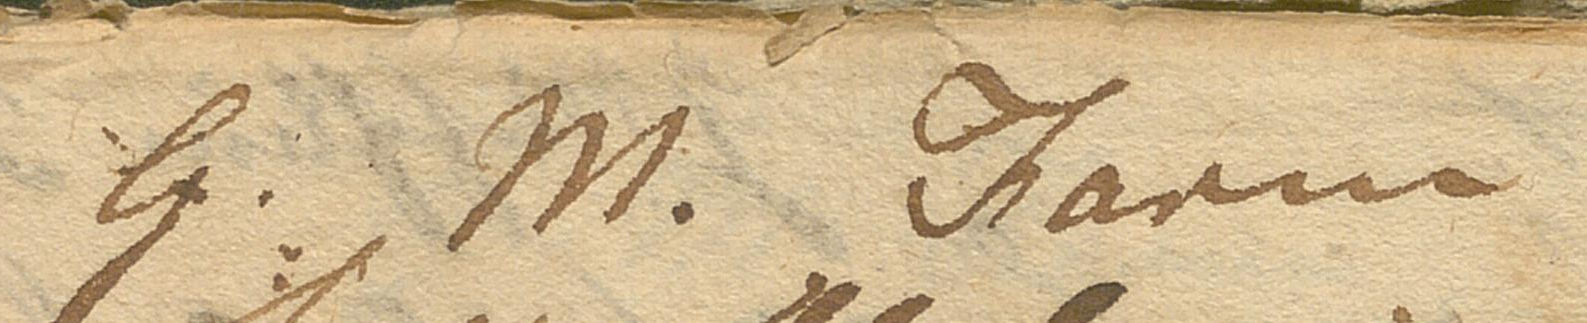G. M. Farm
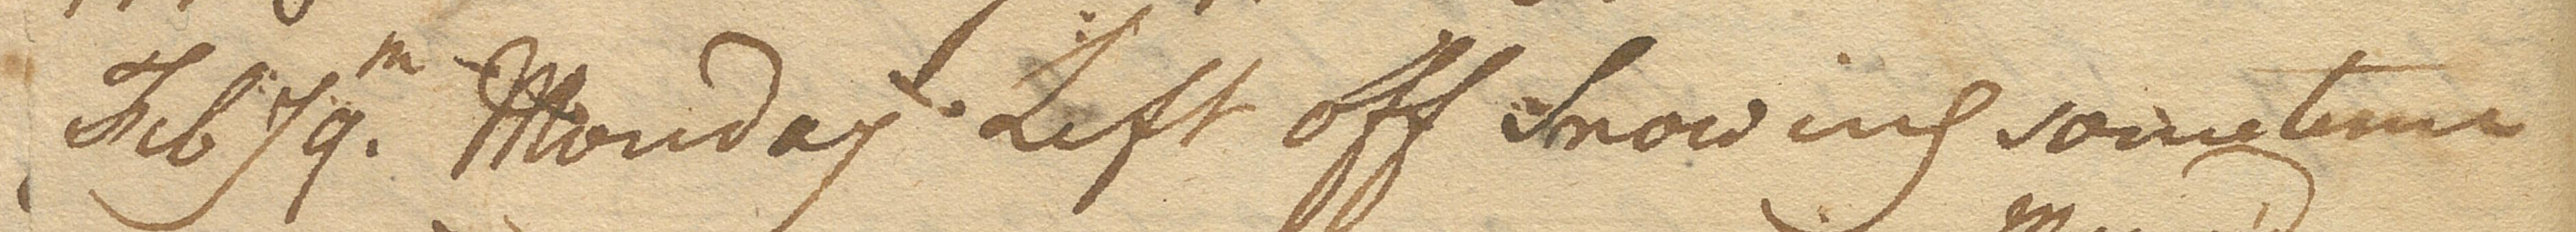Feb^y 9^th. Monday. Left off Snowing sometime
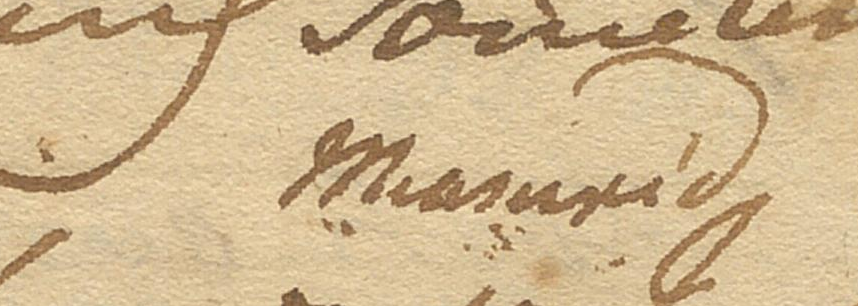Measure'd
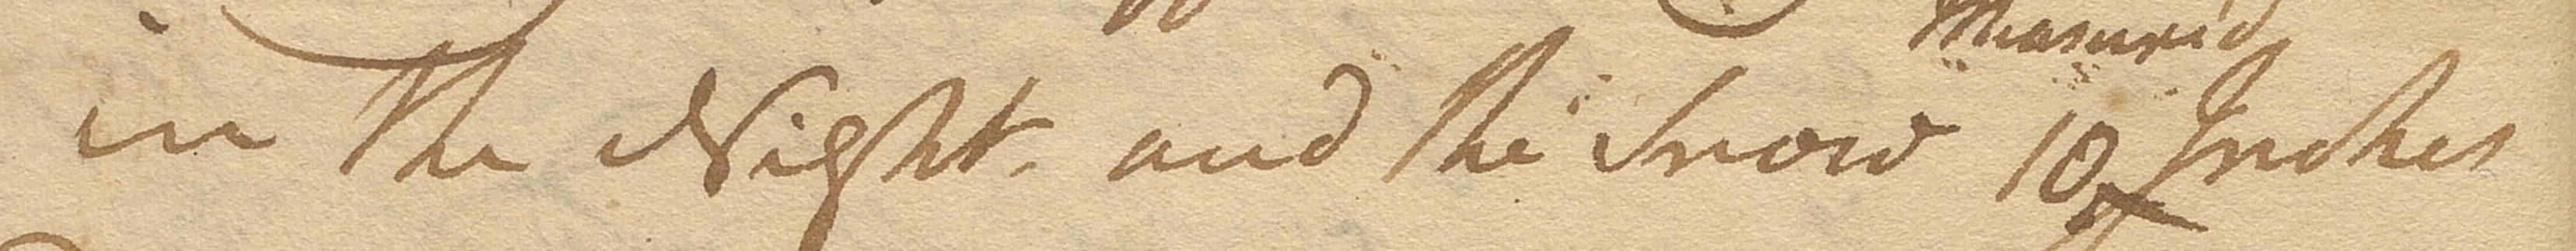in the Night, and the snow 10 ^ Inches
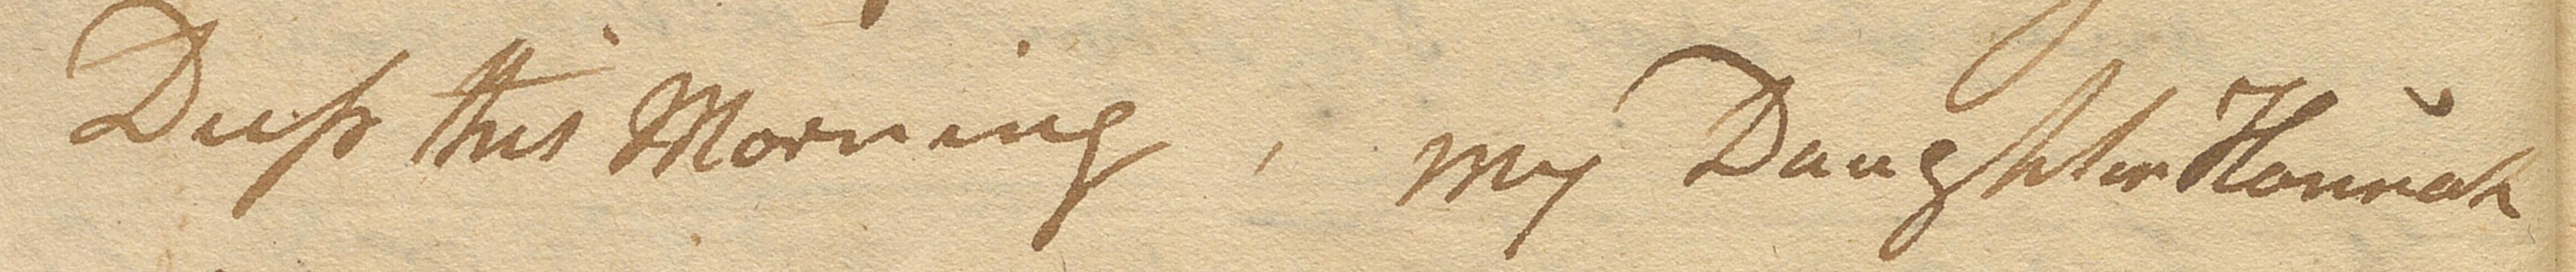Deep his Morning, my Daughter Hannah
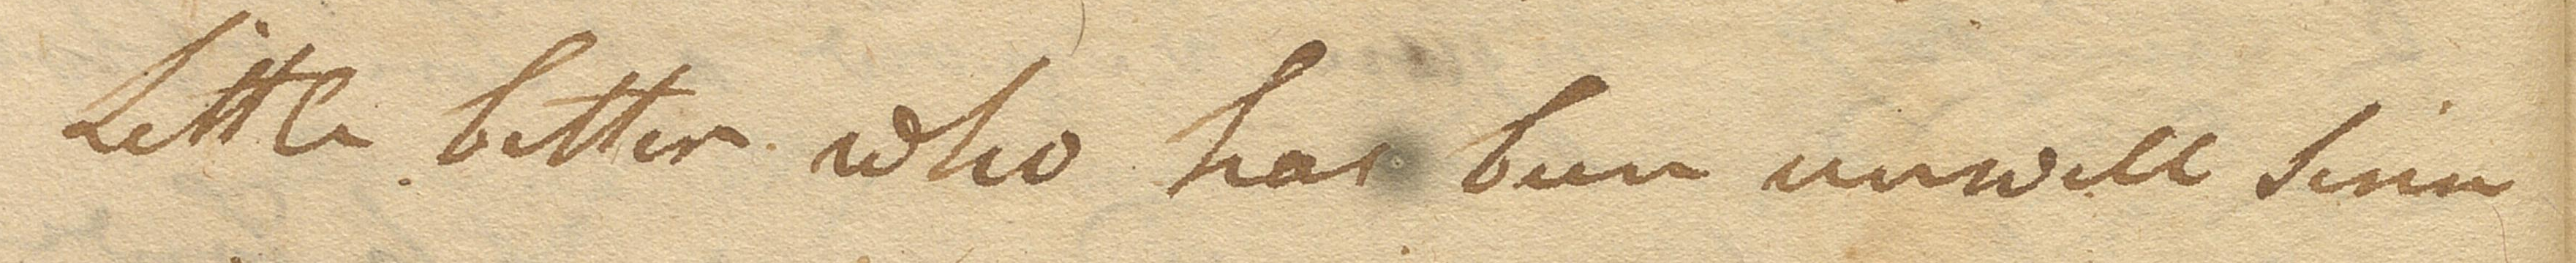Little better who has been unwell Since
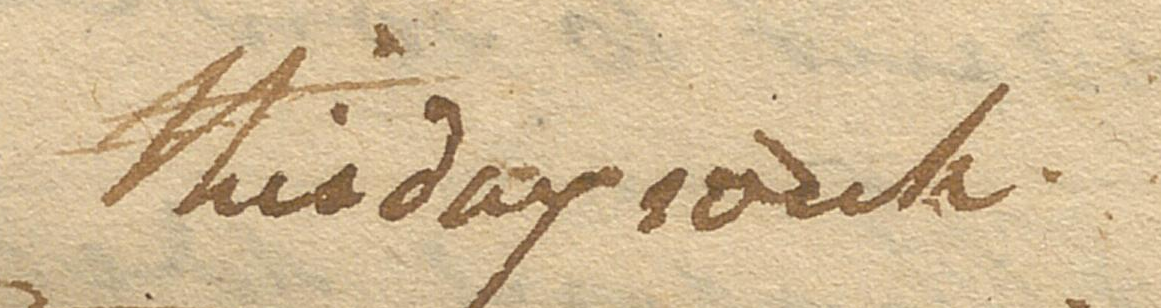this day week
